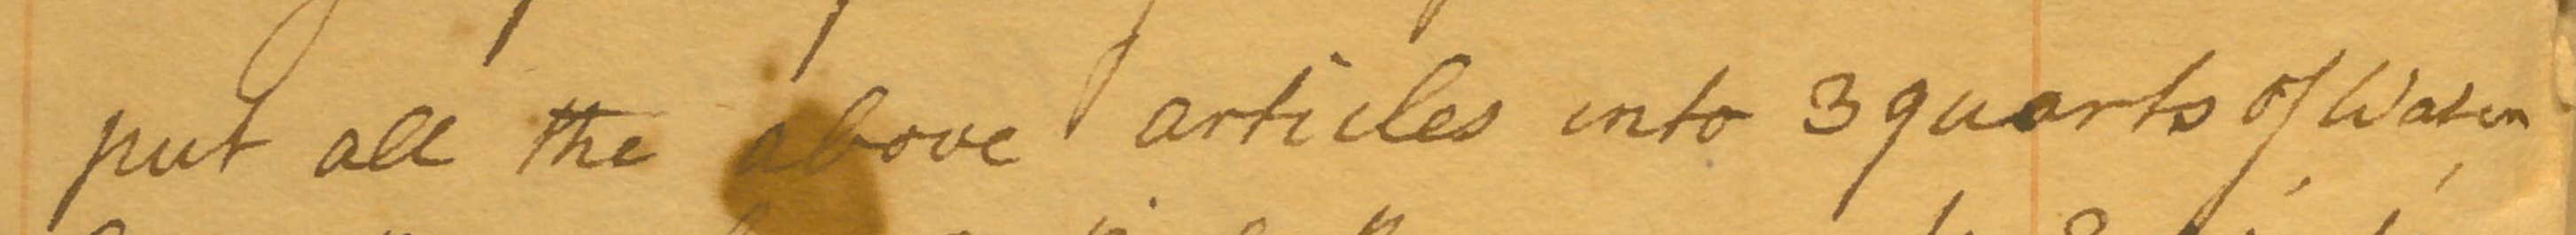put all the above articles into 3 quarts of Water
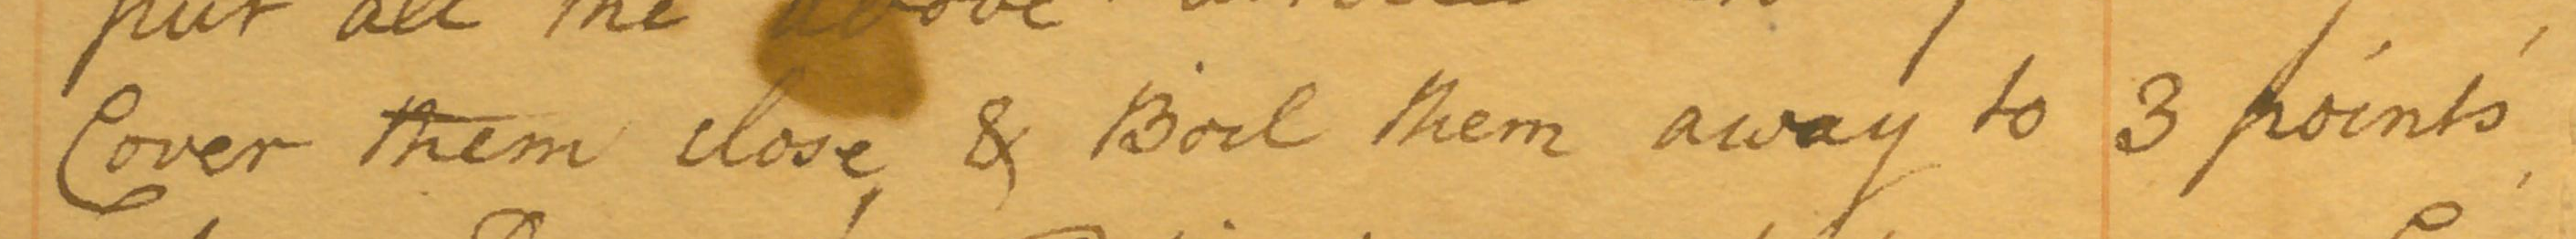Cover them close & Boil them away to 3 points
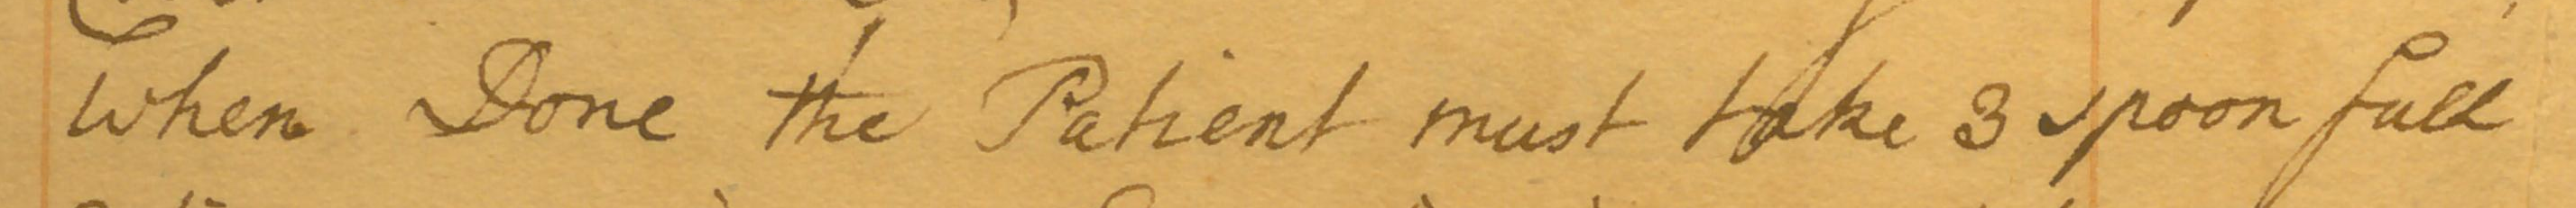when Done the Patient must take 3 spoon full
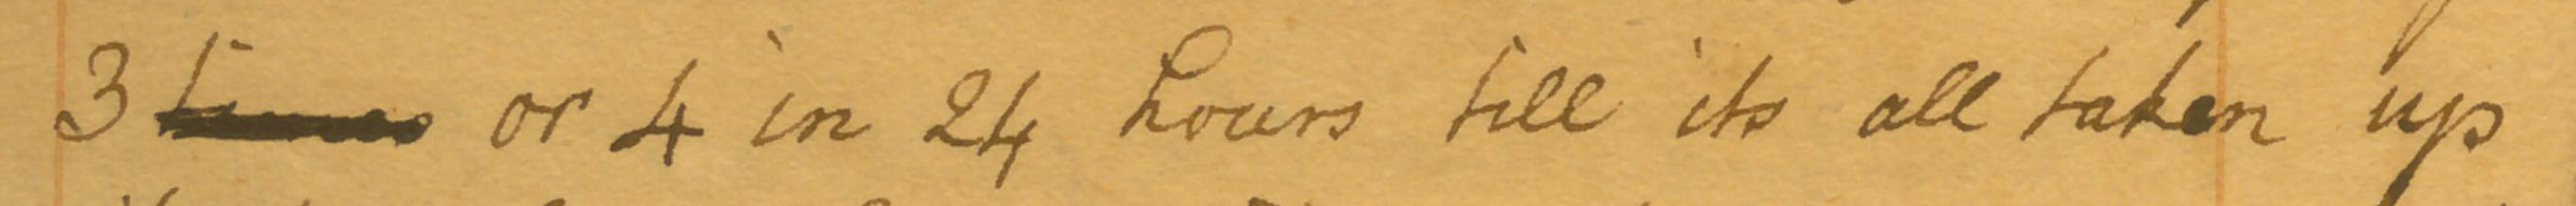3 [_____] or 4 in 24 hours till its all taken up
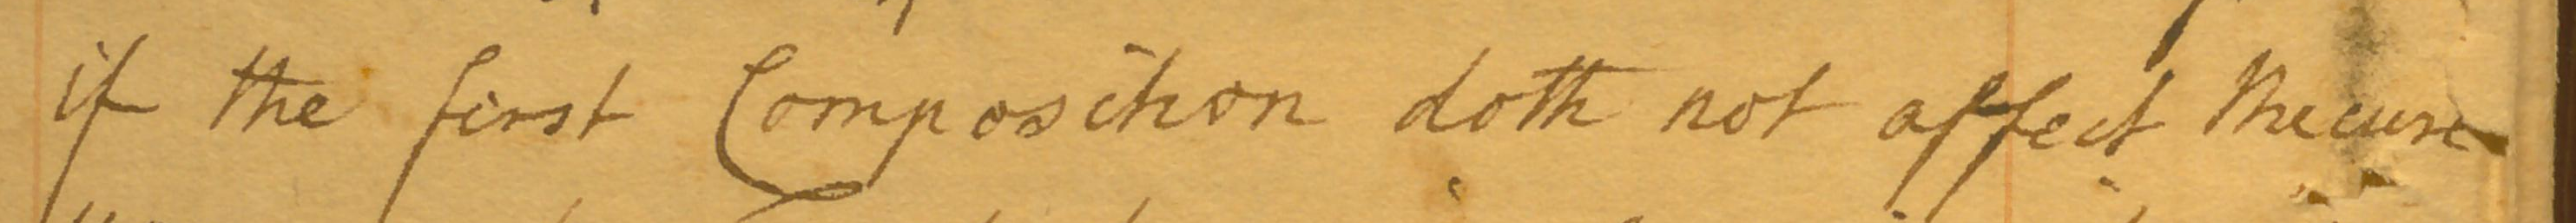if the first Composition doth not affect the cure
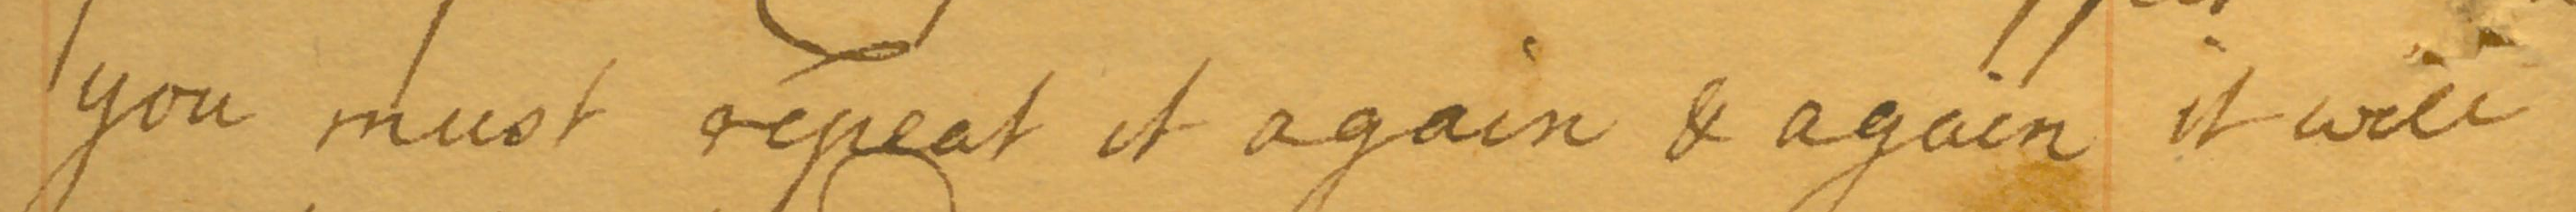you must repeat it again & again it will
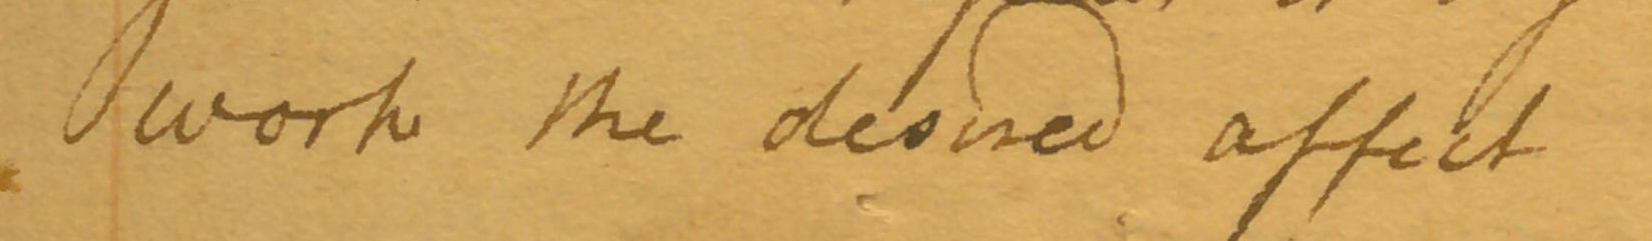work the desired affect
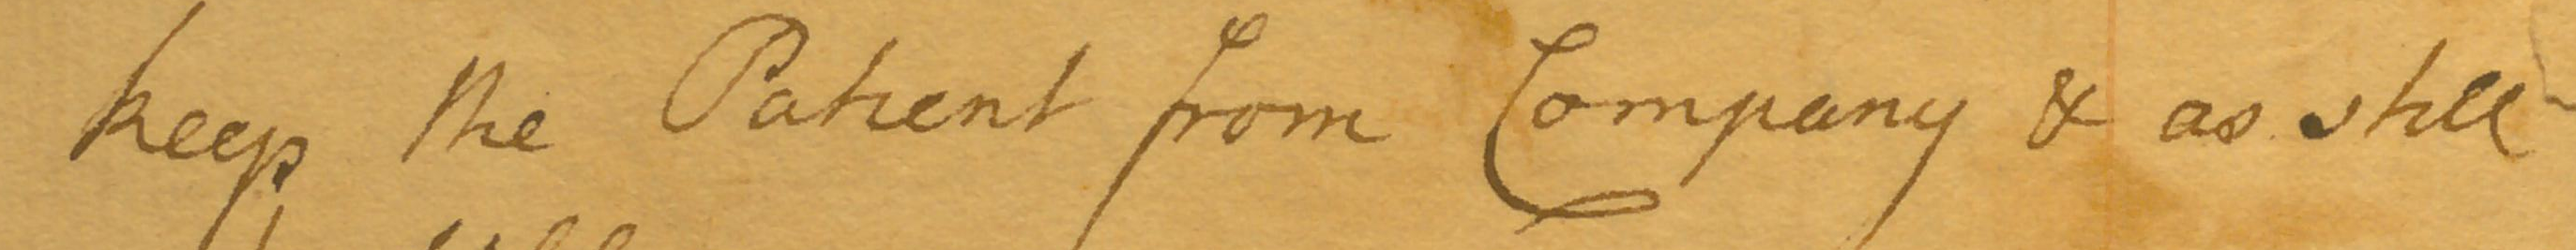keep the Patient from Company & as still
